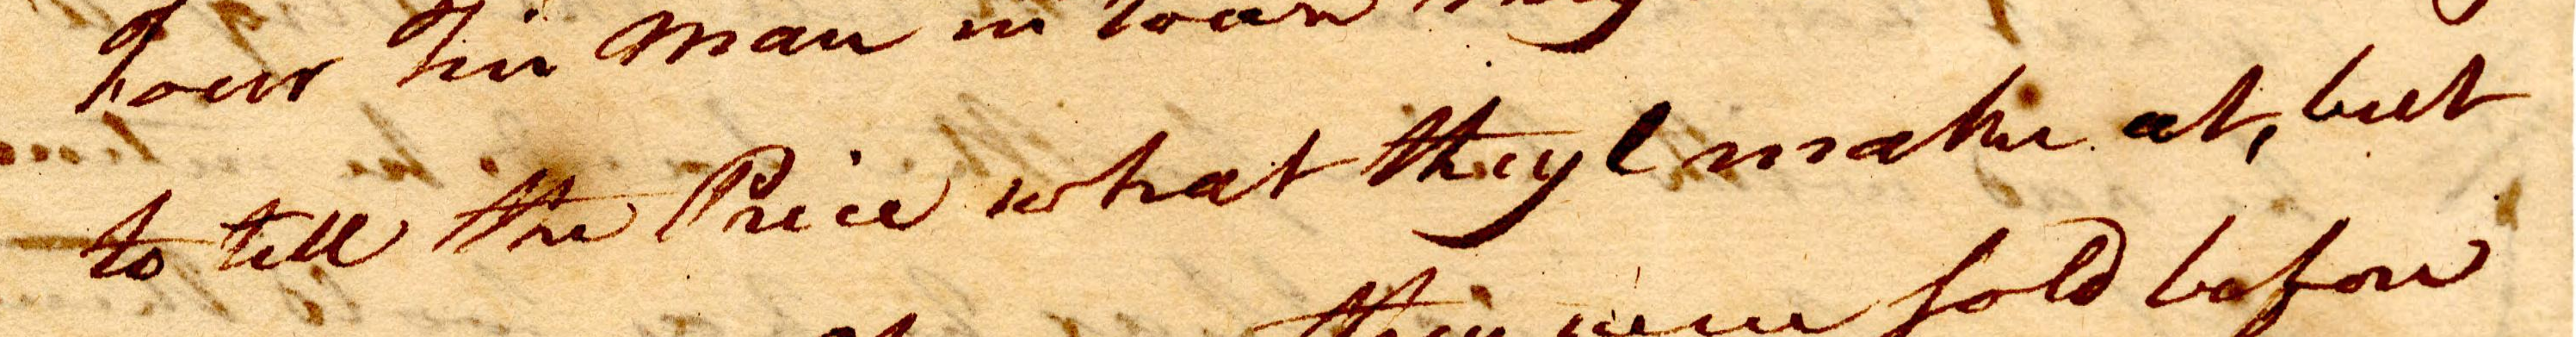to tell the Price what theyl make at, but
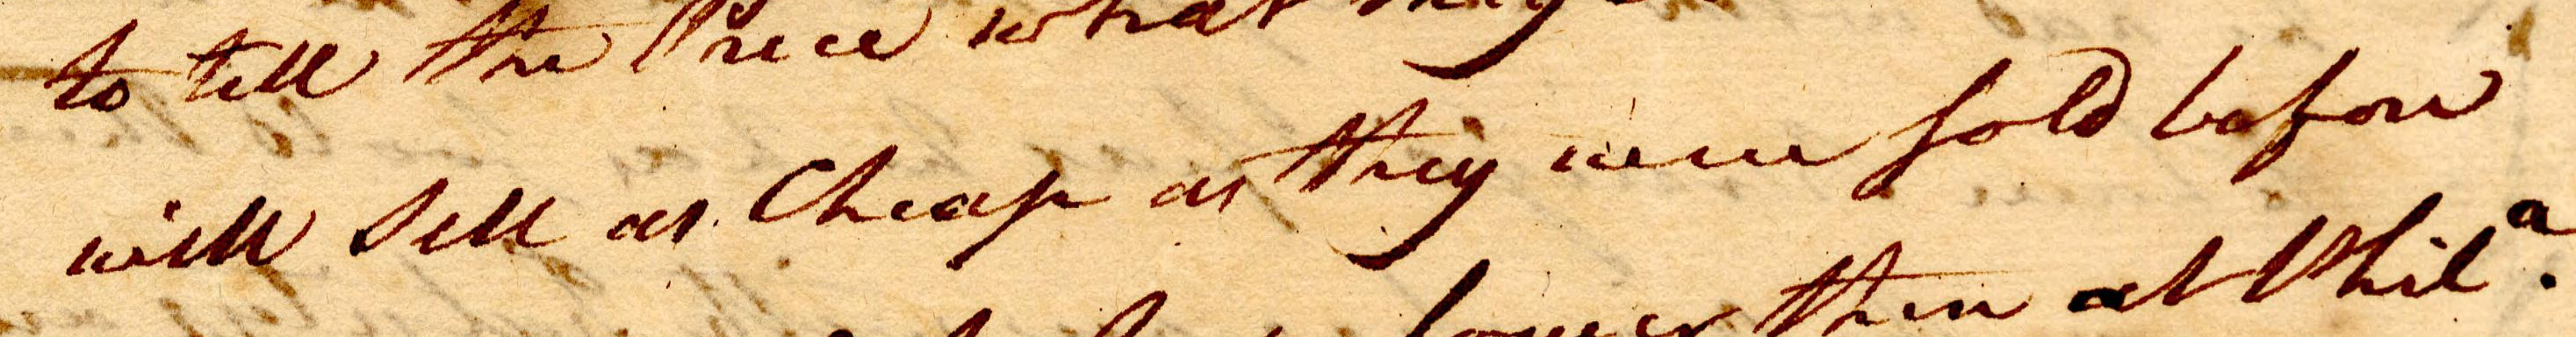will sell as Cheap as they were sold before
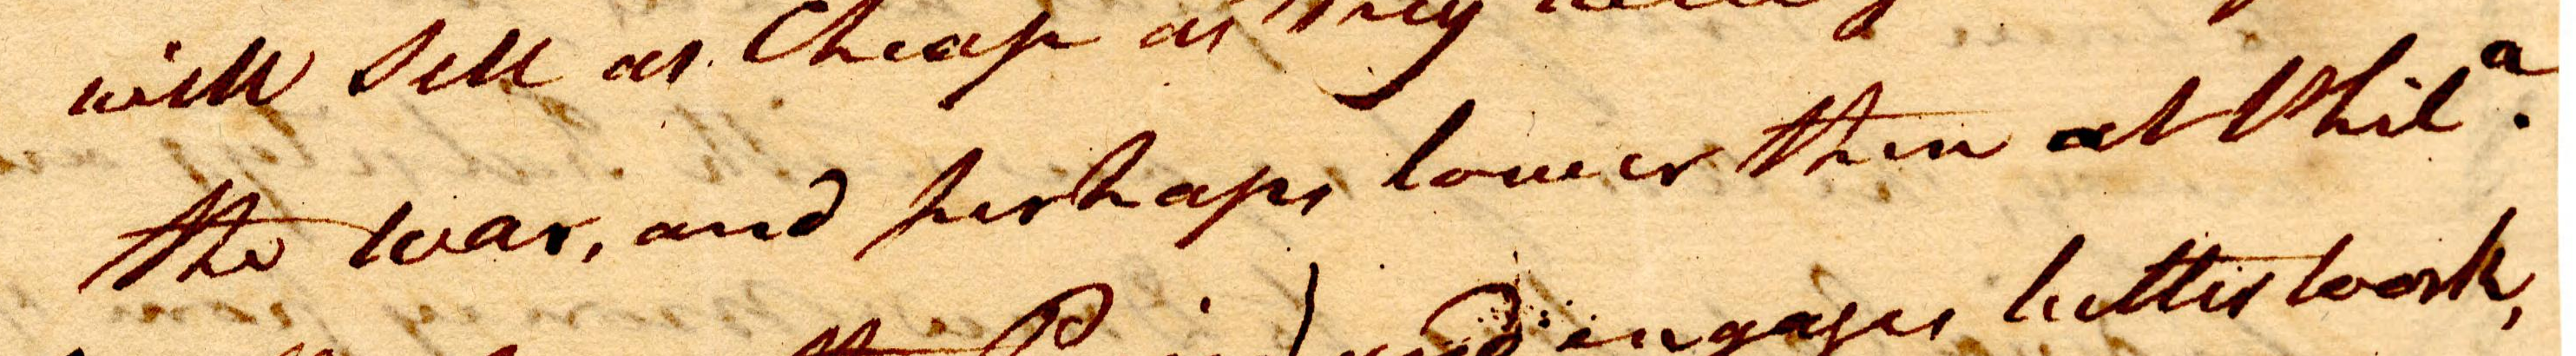the war, and perhaps lower then at Phil^a
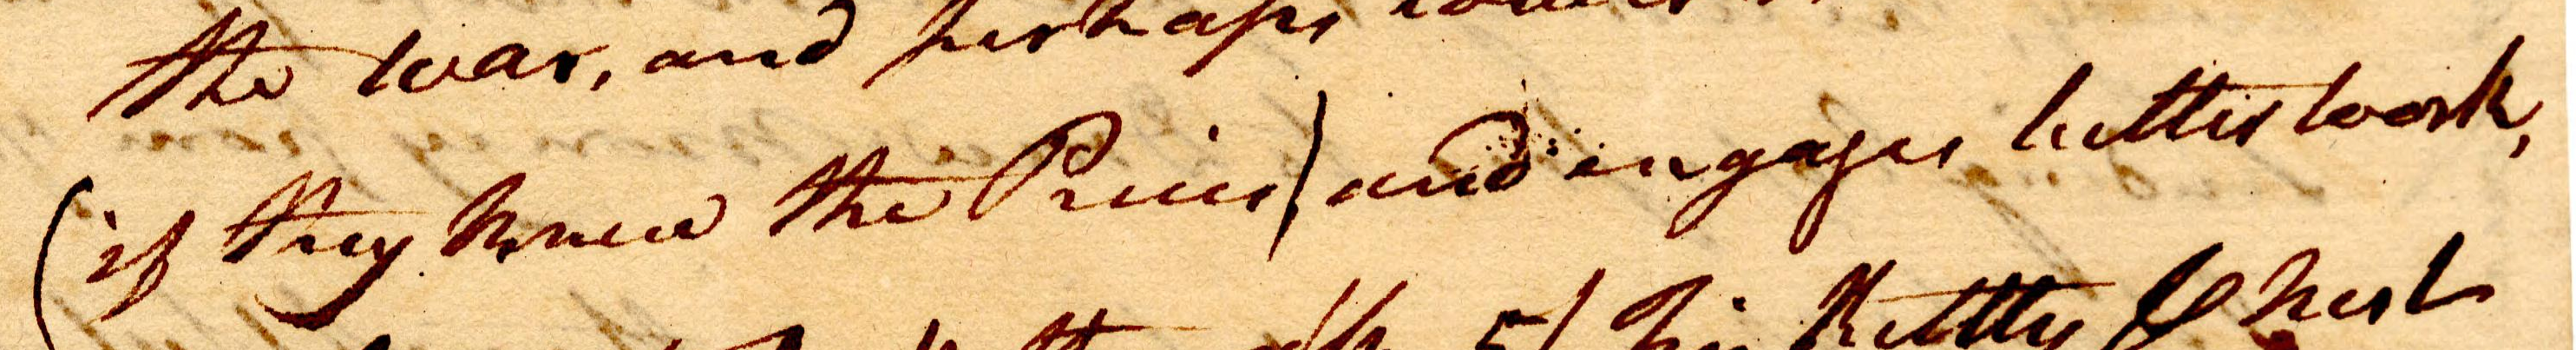(if they knew the Prices) and engages better work,
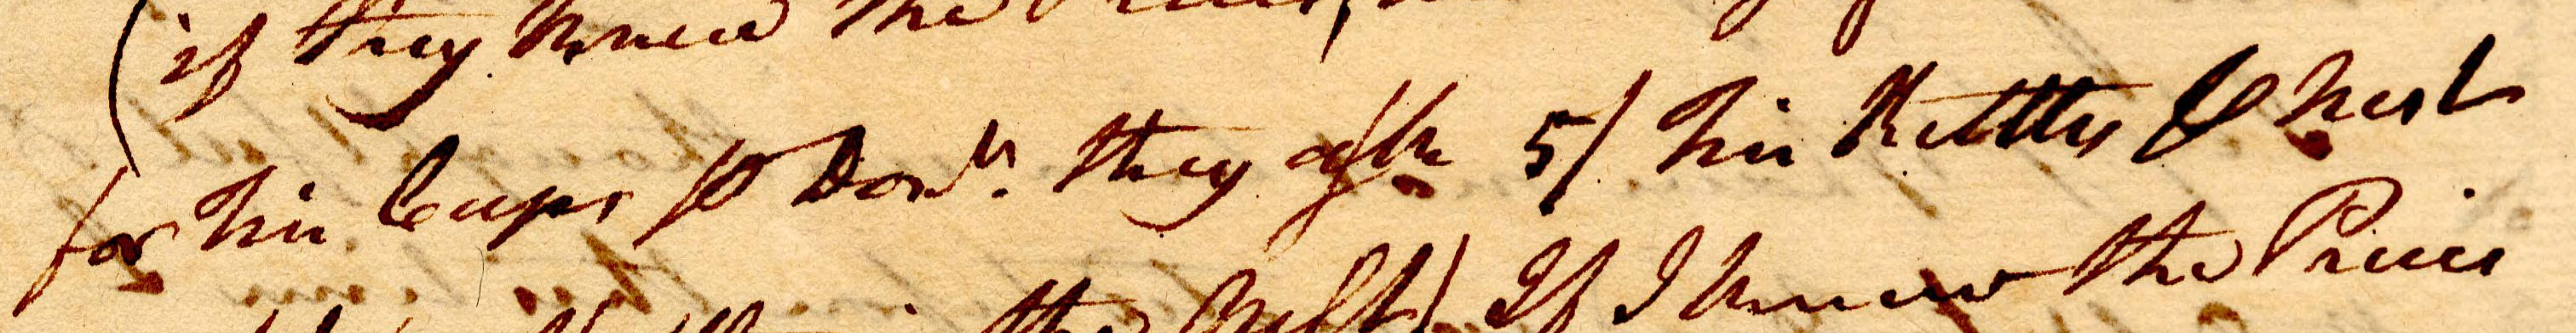for his Cups per Don^l. they offer 5s his Kettles & rest
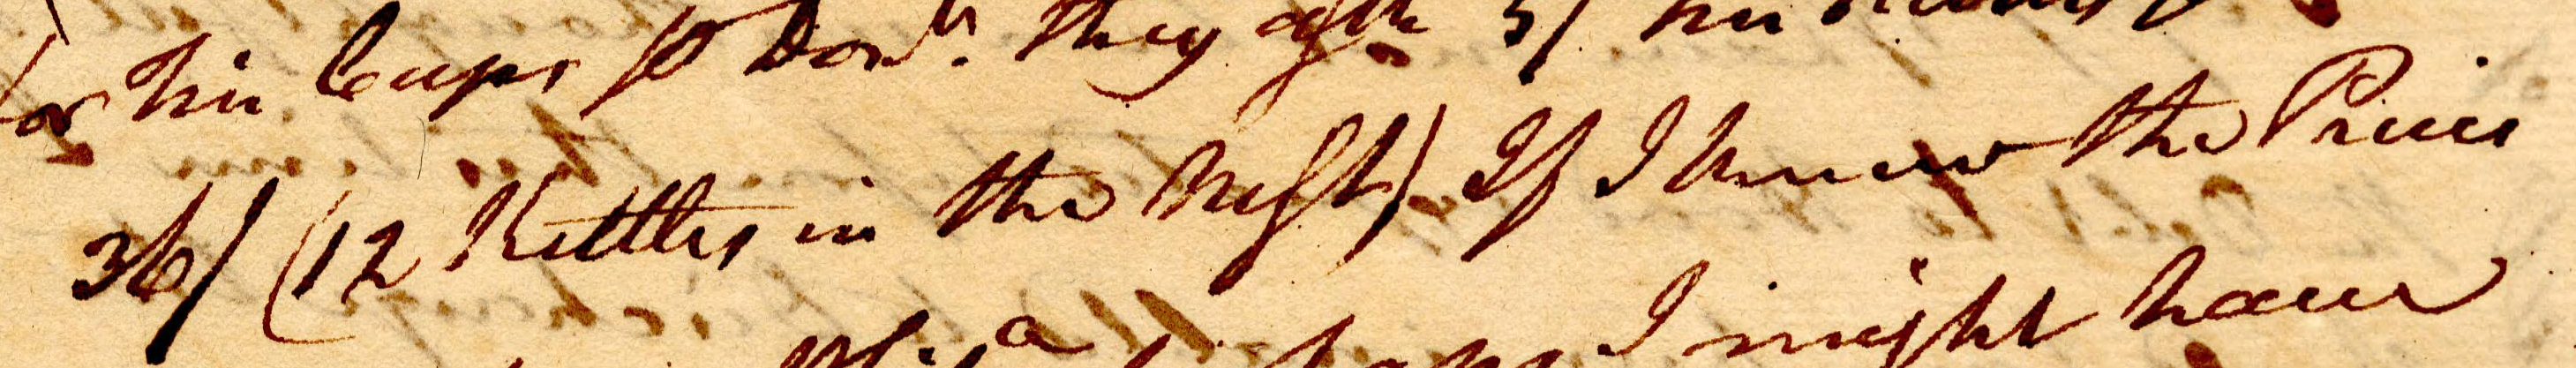46s (12 Kettles in the nest). If I knew the Prices
